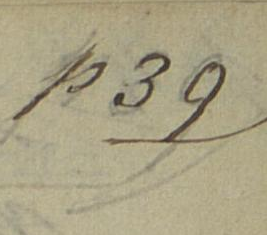p 39
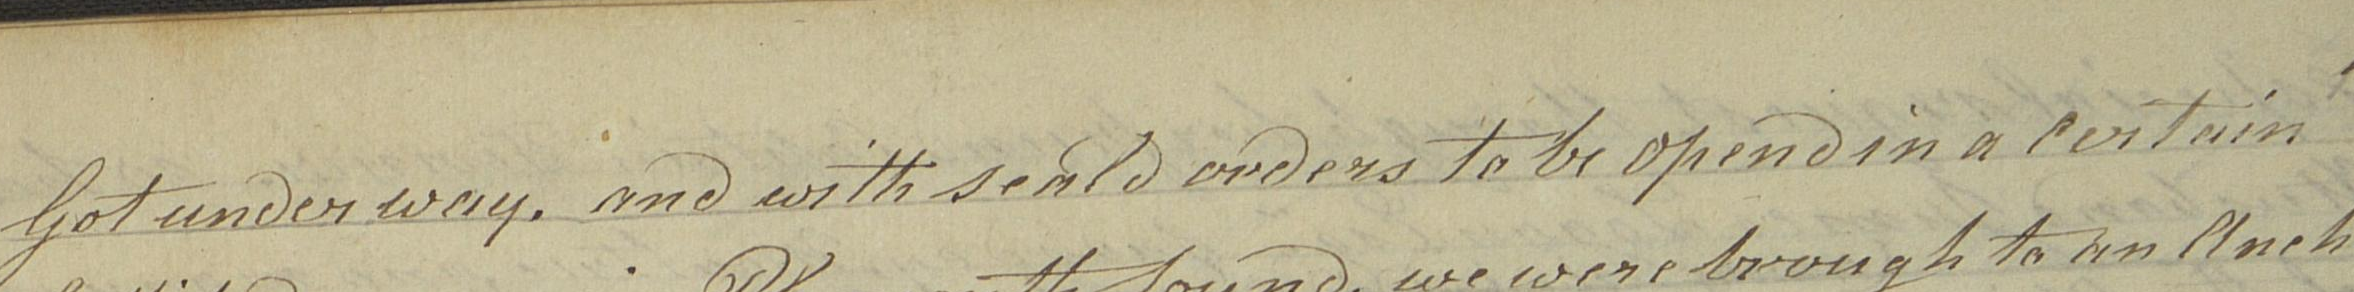Got under way. and with seald orders to be opend in a certain
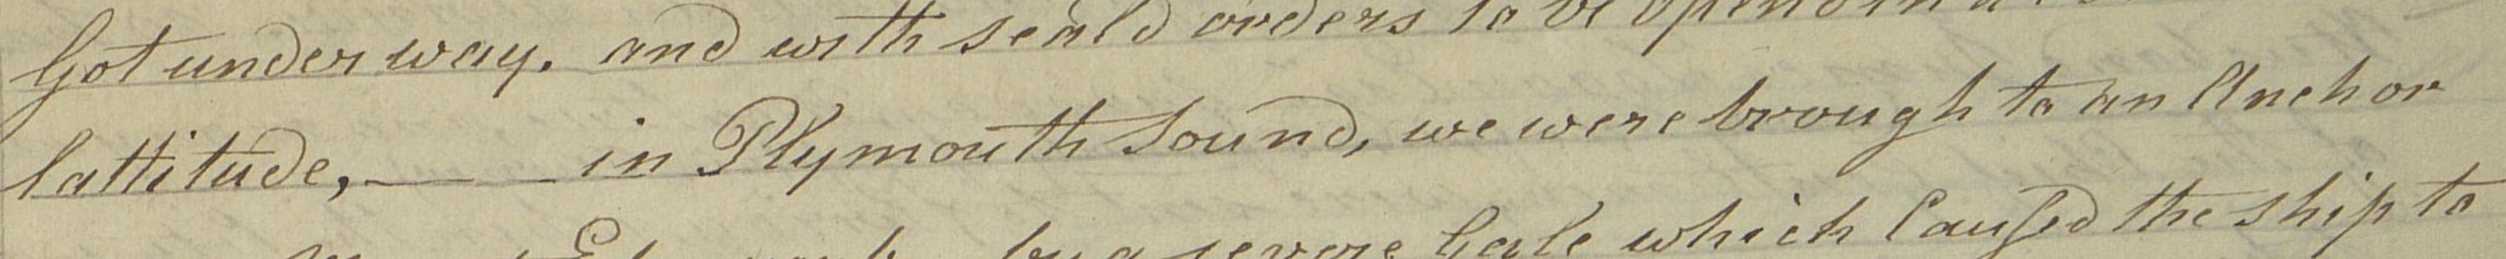lattitade, in Plymouth Sound, we were brough to an Anchor
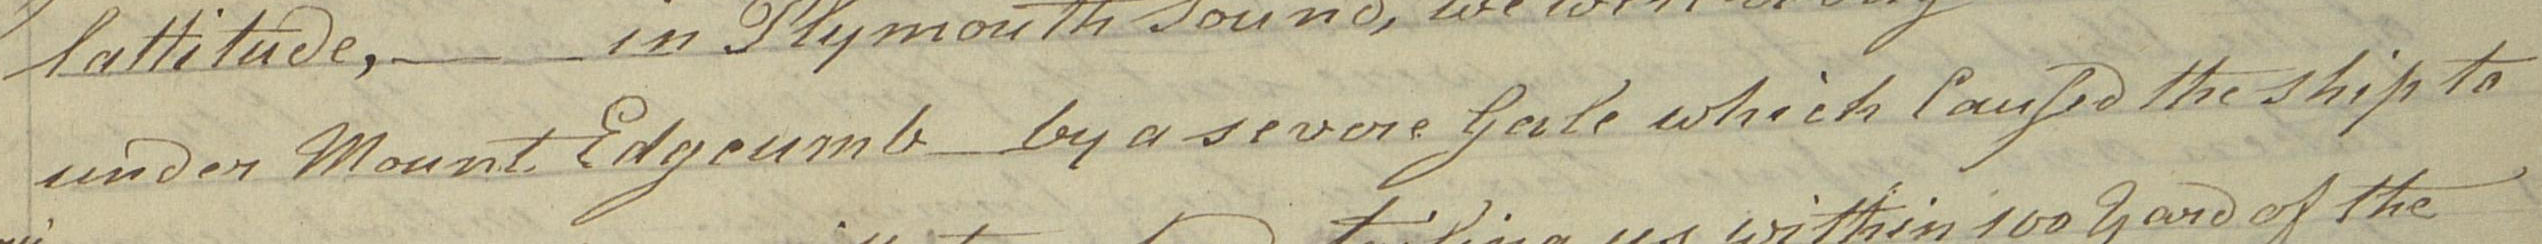under Mount Edgecumb by a severe Gale which Causd the ship to
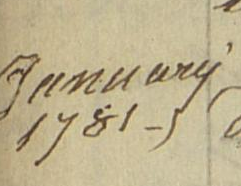January
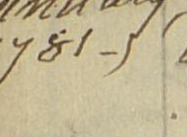1781
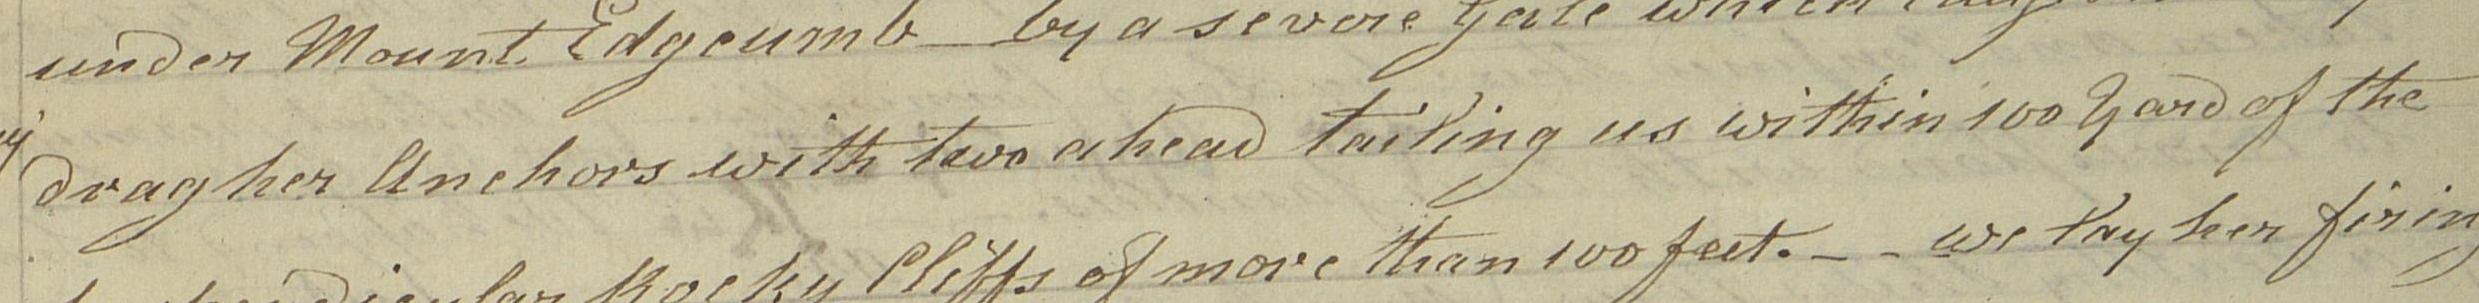drag her Anchors with two ahead tailing us within 100 yard of the
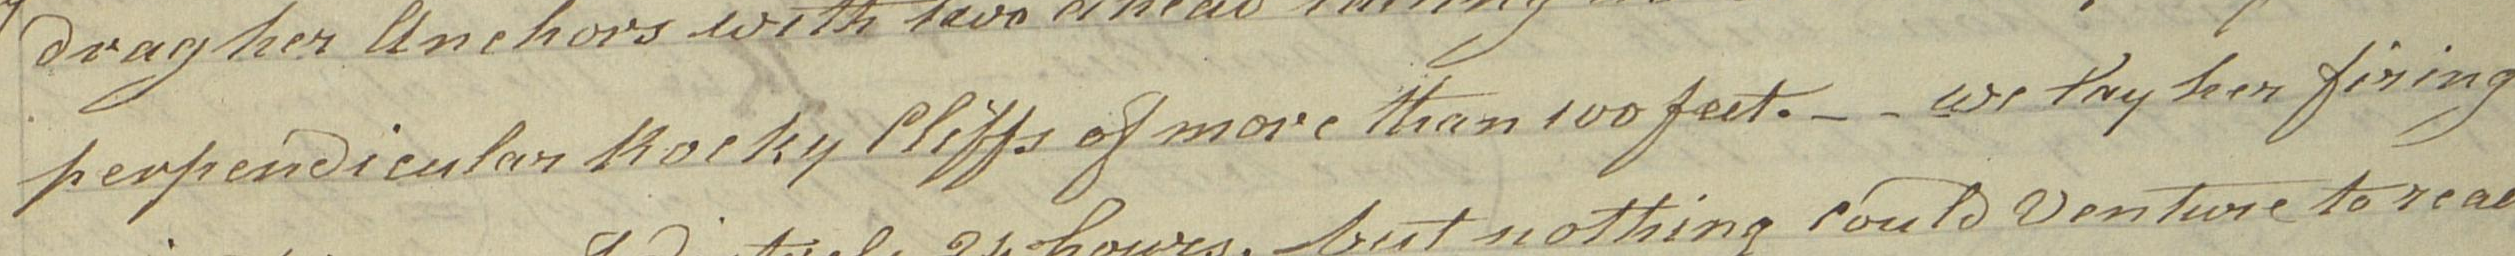perpendicular Rocky Cliffs of more than 100 feet. We lay her firing
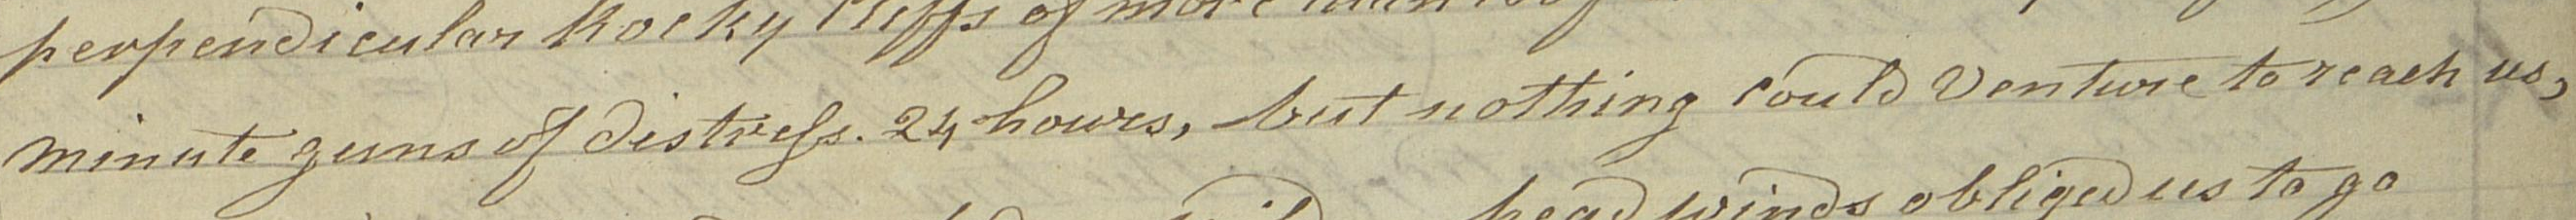minute guns of distress. 24 hours, but nothing could Venture to reach us,
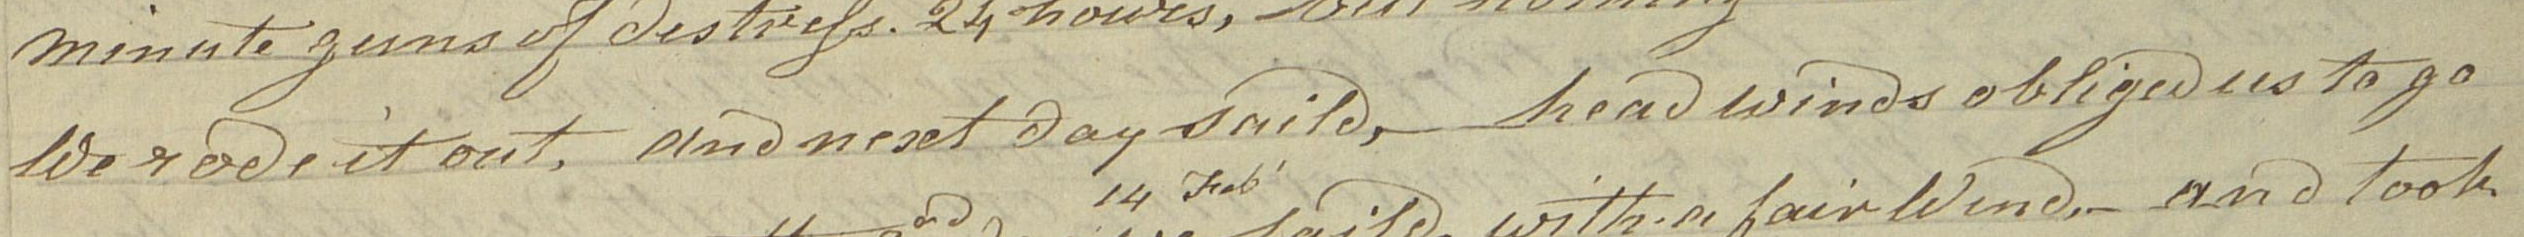We rode it out, and next day saild, head winds obliged us to go
